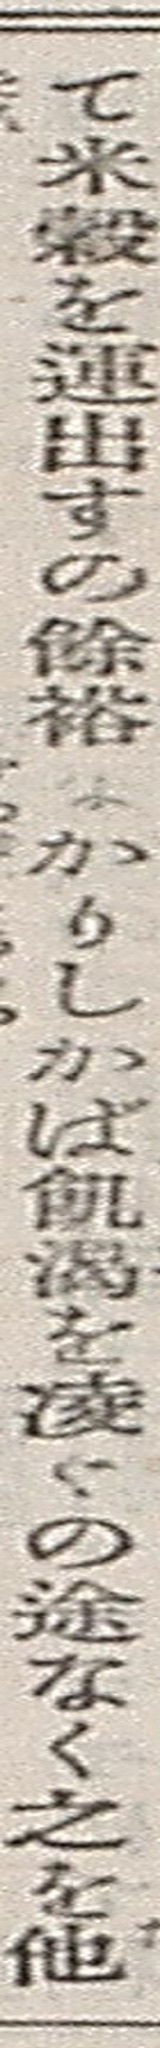て米穀を運出すの餘裕なかりしかば飢渇を凌ぐの途なく之を他
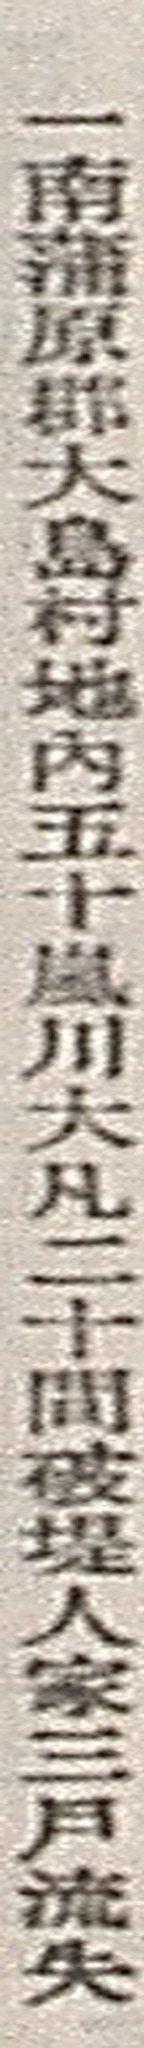一南蒲原郡大島村地内五十嵐川大凡二十間破堤人家三戸流失
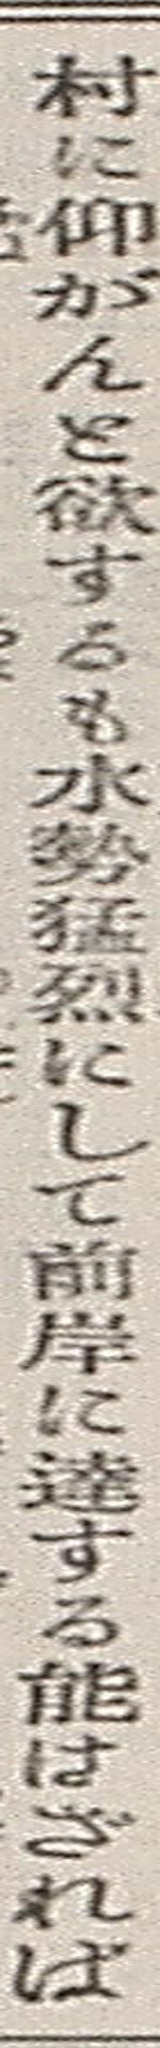村に仰がんと欲するも水勢猛烈にして前岸に達する能はざれば
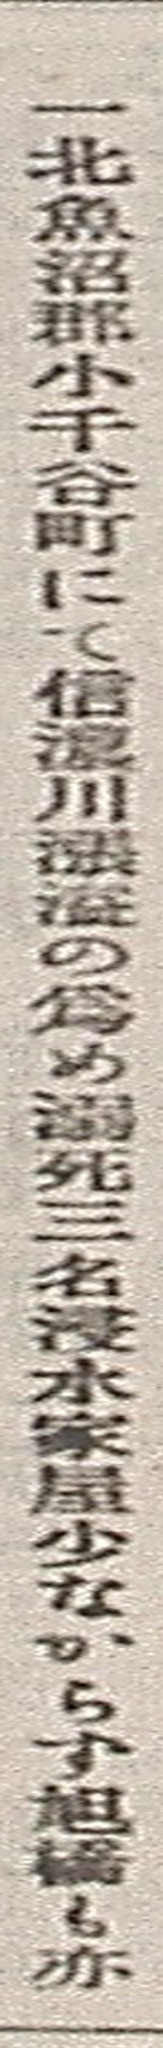一北魚沼郡小千谷町にて信濃川漲溢の為め溺死三名浸水家屋少なからず旭橋も亦
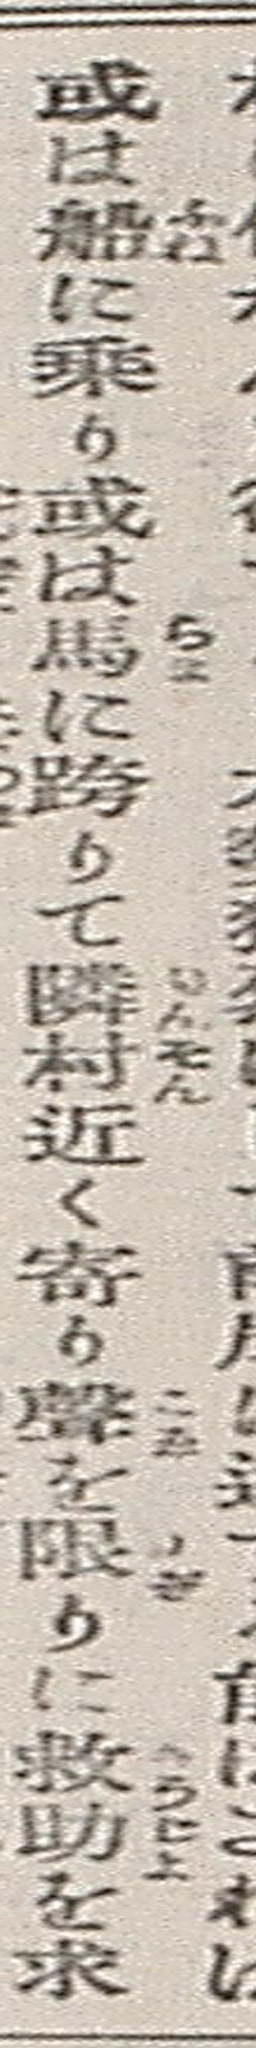或は船に乗り或は馬に跨りて隣村近く寄り声を限りに救助を求
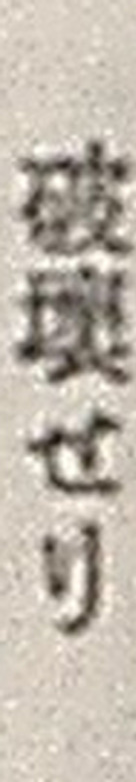破壊せり
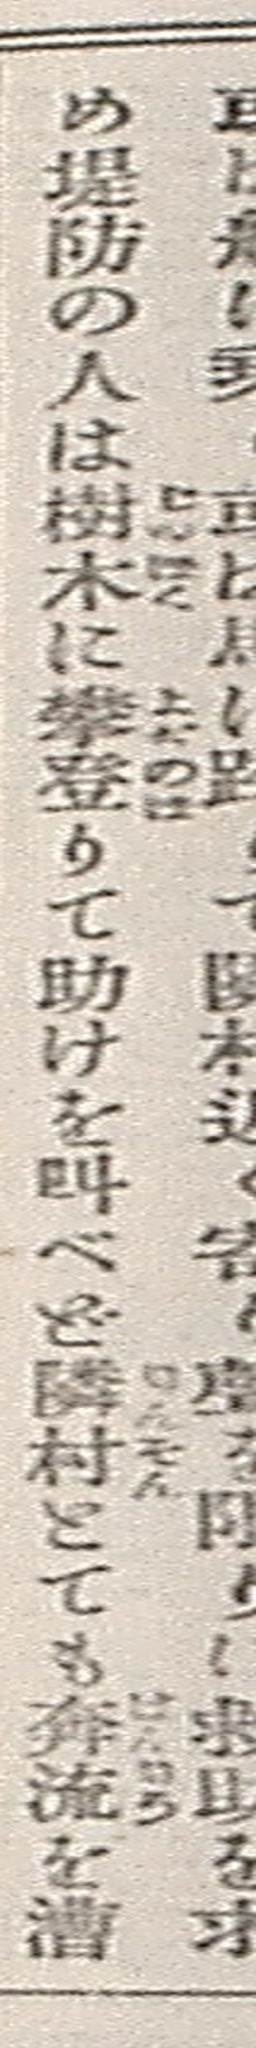め堤防の人は樹木に攀登りて助けを叫べば隣村とても奔流を漕
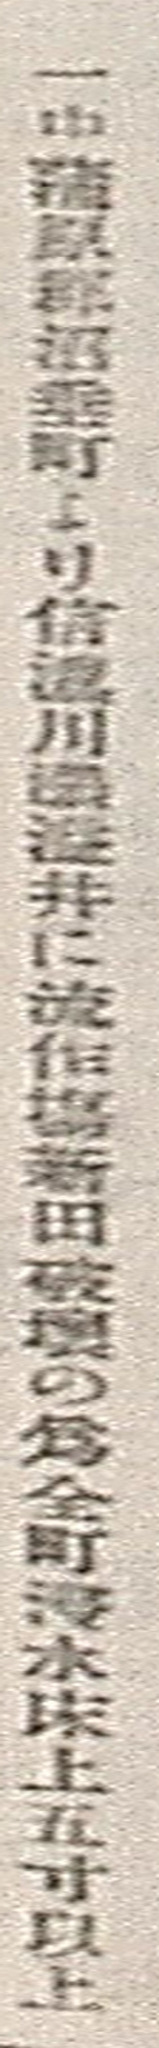一中蒲原郡沼垂町より信濃川漲溢并に流作場新田破壊の為全町浸水床上五寸以上
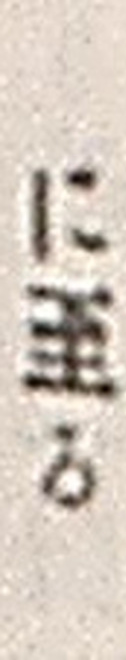に至る
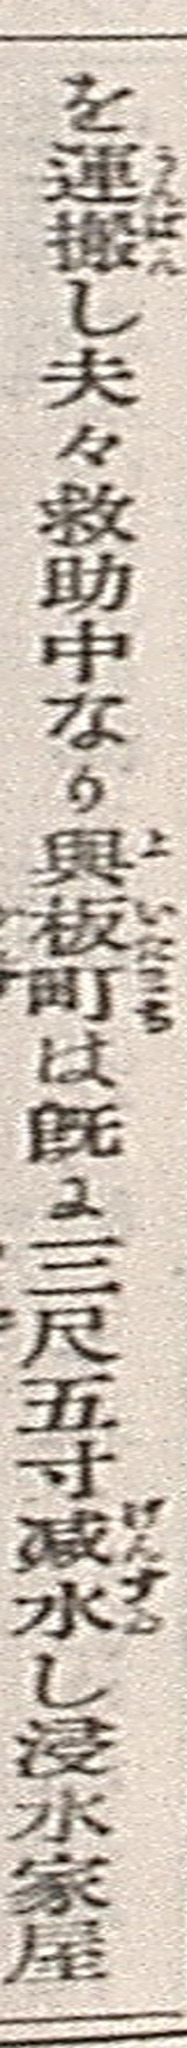を運搬し夫々救助中なり与板町は既に三尺五寸減水し浸水家屋
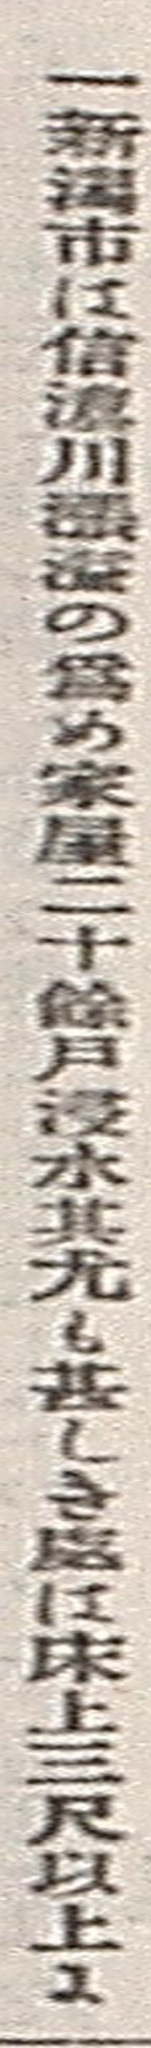一新潟市は信濃川漲溢の為め家屋二十餘戸浸水其尤も甚しき処は床上三尺以上に
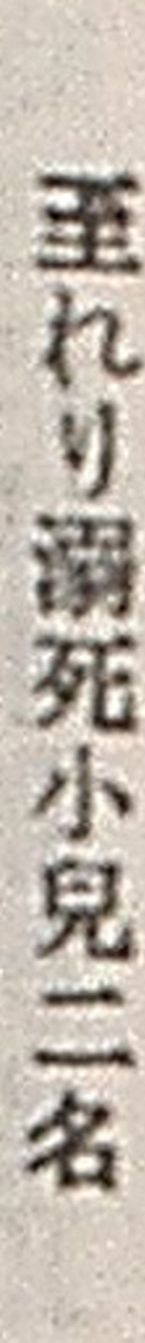至れり溺死小兒二名
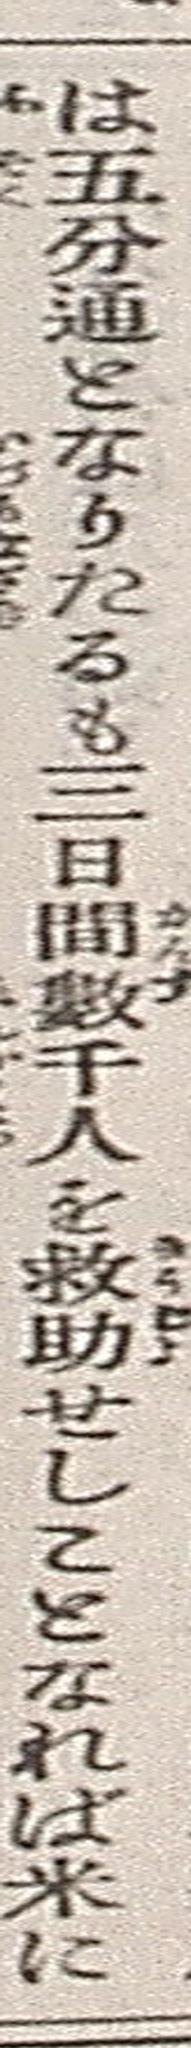は五分通となりたるも三日間数千人を救助せしことなれば米に
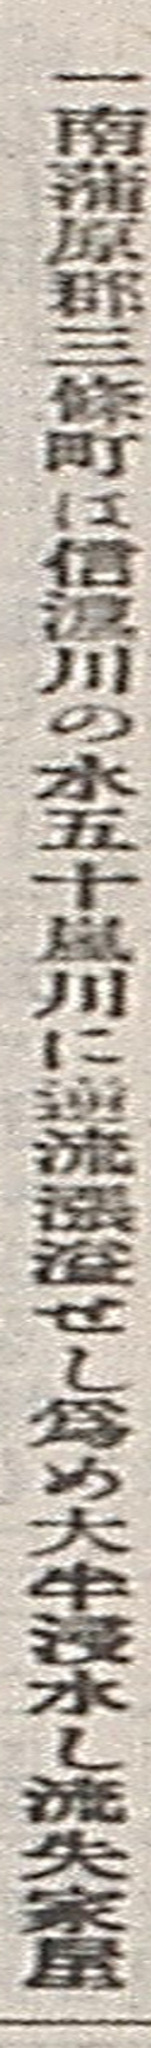一南蒲原郡三條町は信濃川の水五十嵐川に逆流漲溢せし為め大半浸水し流失家屋
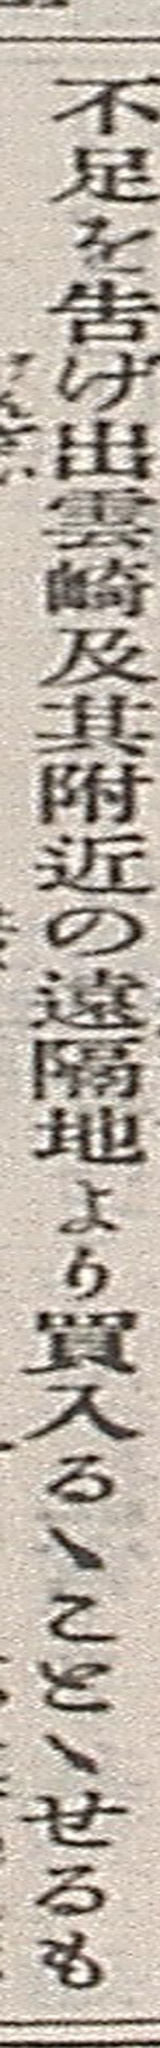不足を告げ出雲崎及其附近の遠隔地より賈入るゝことゝせるも
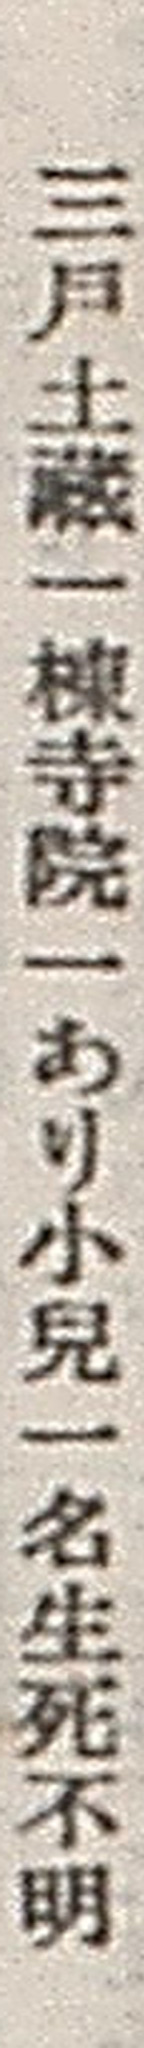三戸土蔵一棟寺院一あり小兒一名生死不明
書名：風俗畫報臨時増刊第百二十八號　洪水被害録（下）
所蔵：東京大学地震研究所図書室 Earthquake Research Institute Library, The University of Tokyo, JAPAN
